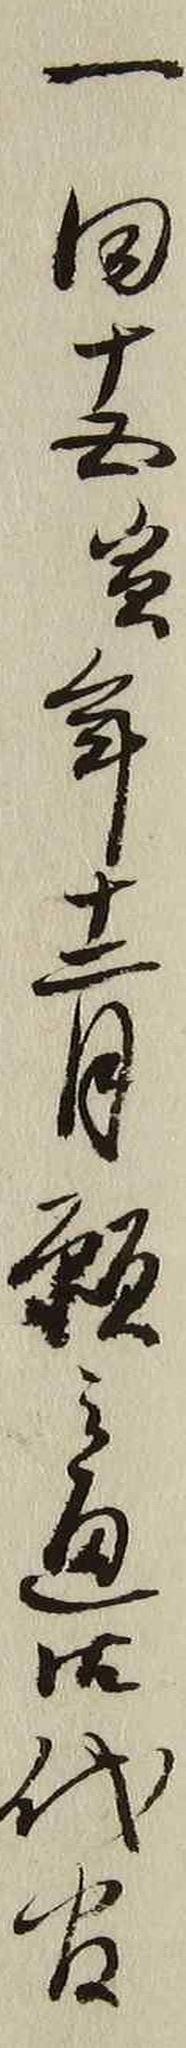一同十五寅年十二月願之通御代官
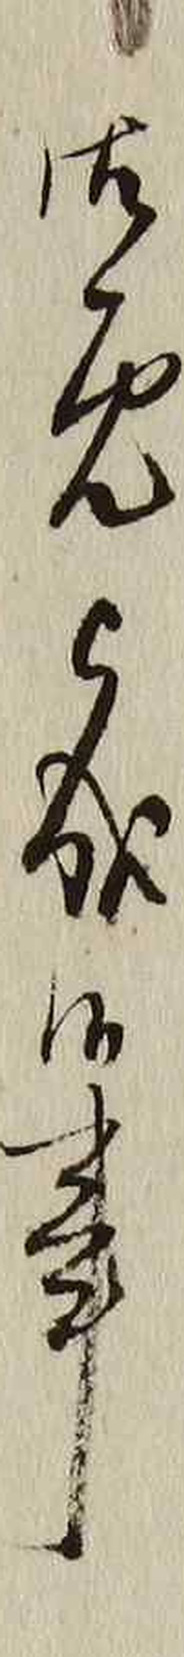御免被成候事
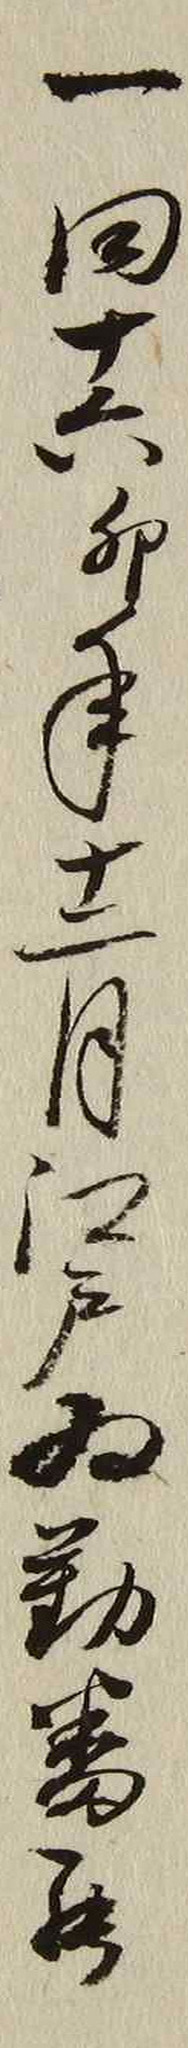一同十六卯年十二月江戸為勤番罷
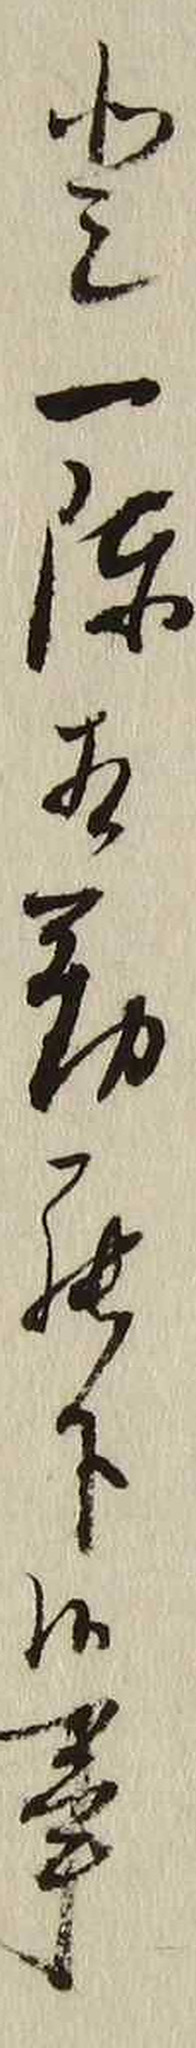登一陣相勤罷下候事
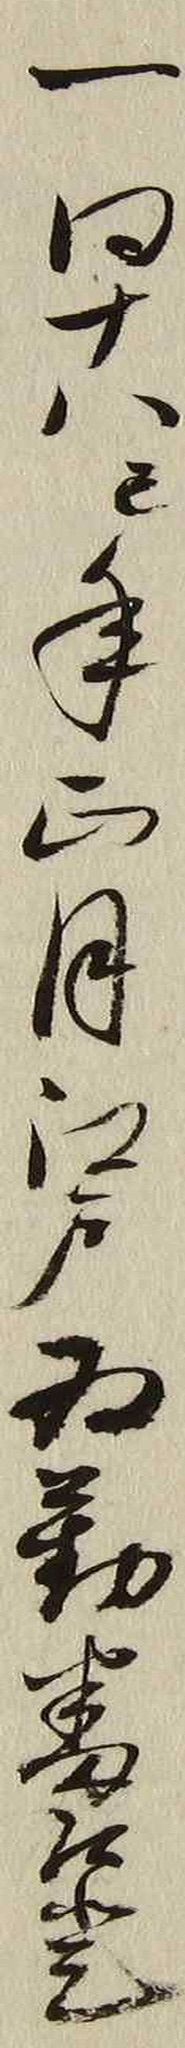一同十八巳年正月江戸為勤番罷登
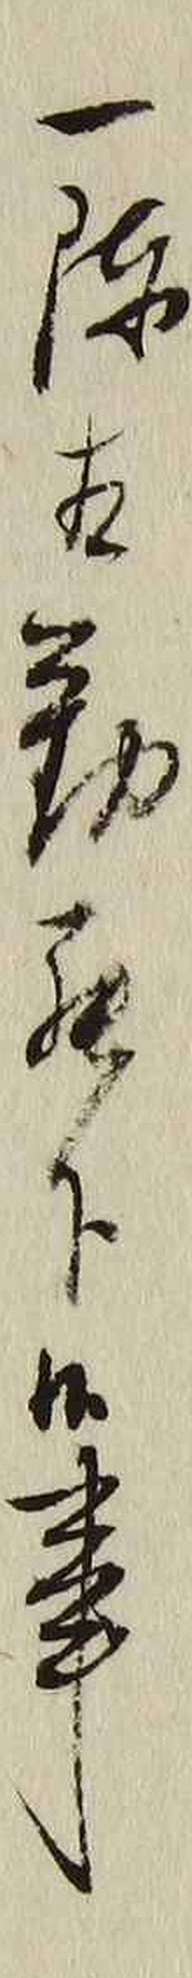一陣相勤罷下候事
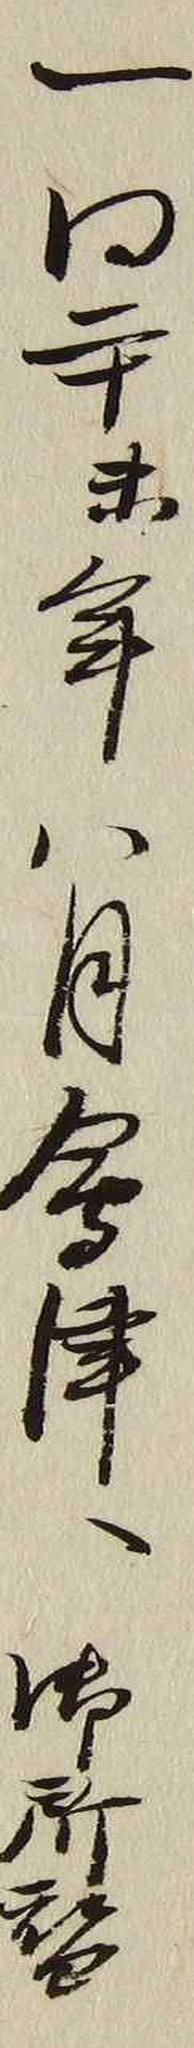一同二十未年八月会津へ御所替
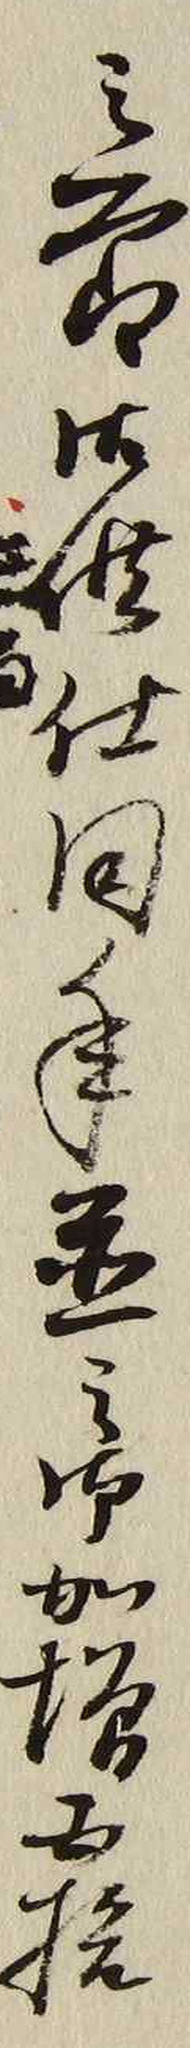之節御供仕同年並之御加増五拾
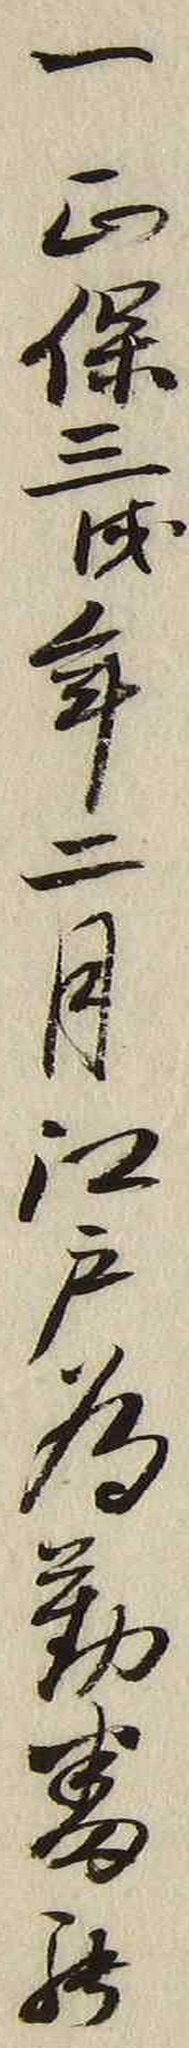一正保三戌年二月江戸為勤番罷

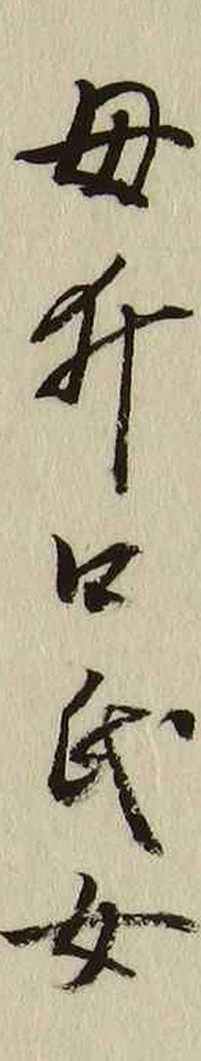母井口氏女
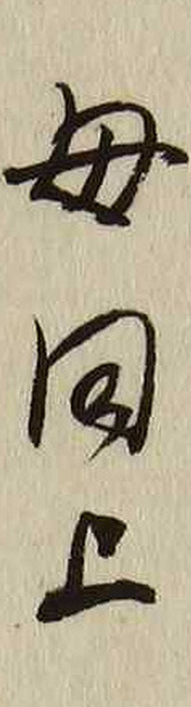母同上
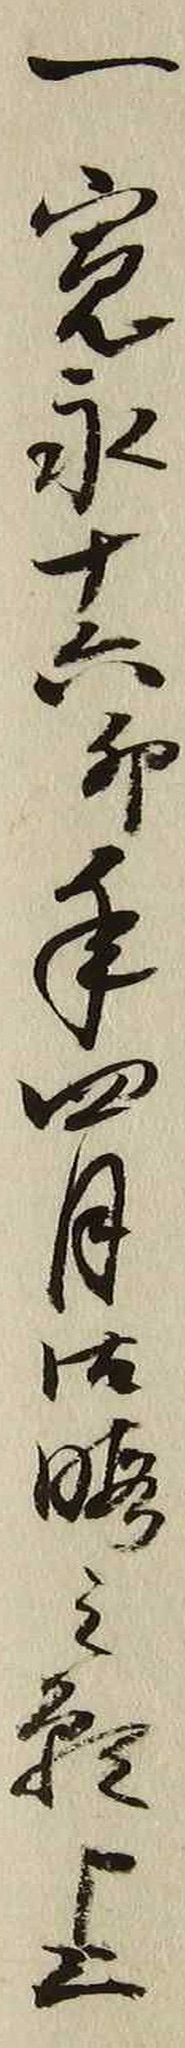一寛永十六卯年四月御暇之願申上
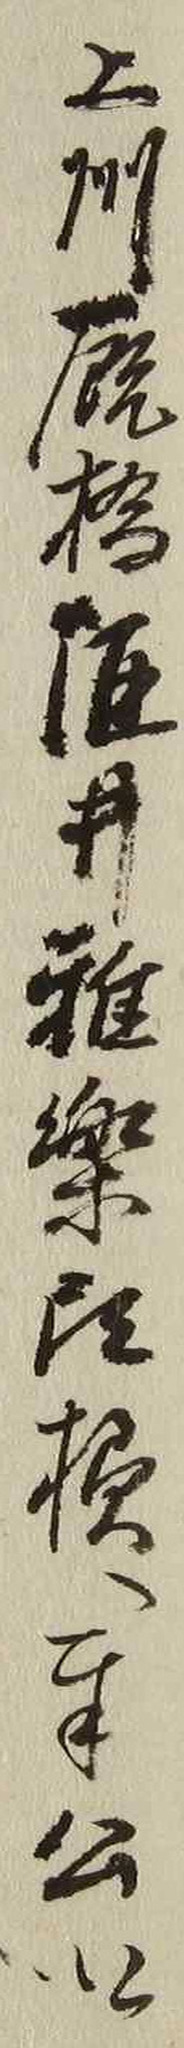上州厩橋酒井雅楽頭様へ奉公い
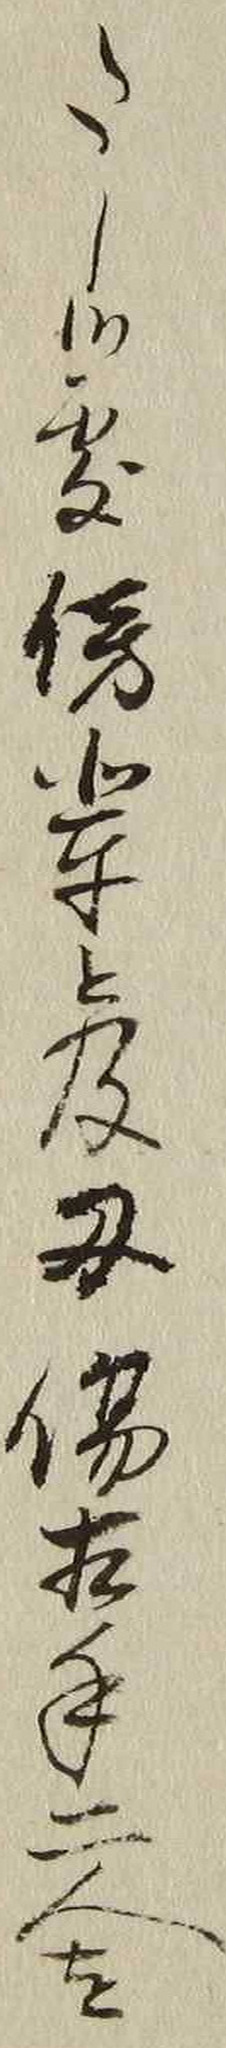たし候処傍輩と及刃傷相手二人を
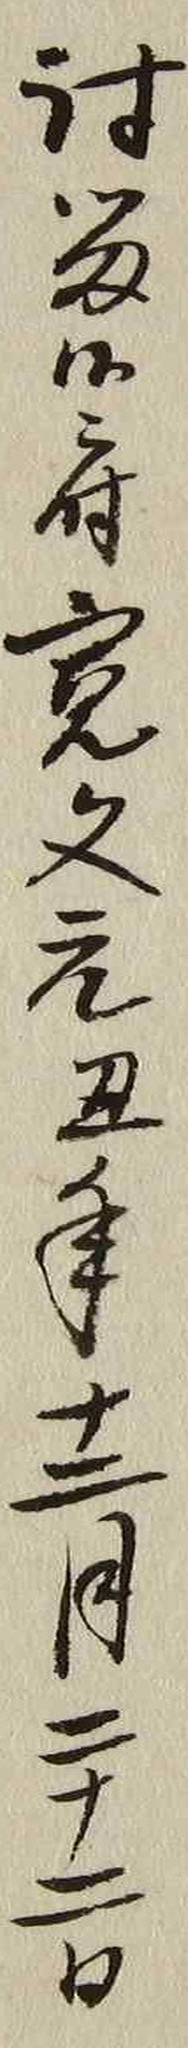討留候ニ付寛文元丑年十二月二十二日
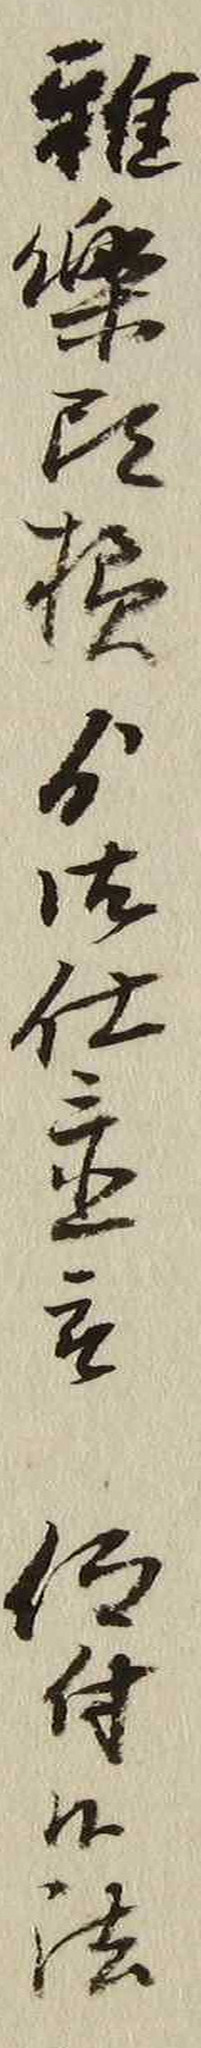雅楽頭様ゟ御仕置被仰付候法
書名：諸士系譜　巻之356　す之部6
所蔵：会津若松市立会津図書館
